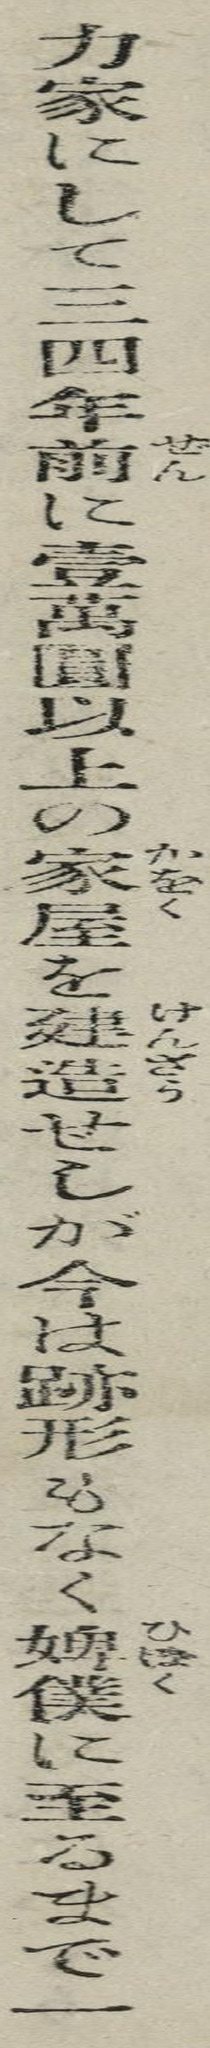力家にして三四年前に壹万圓以上の家屋を建造せしが今は跡形もなく碑僕に至るまで一
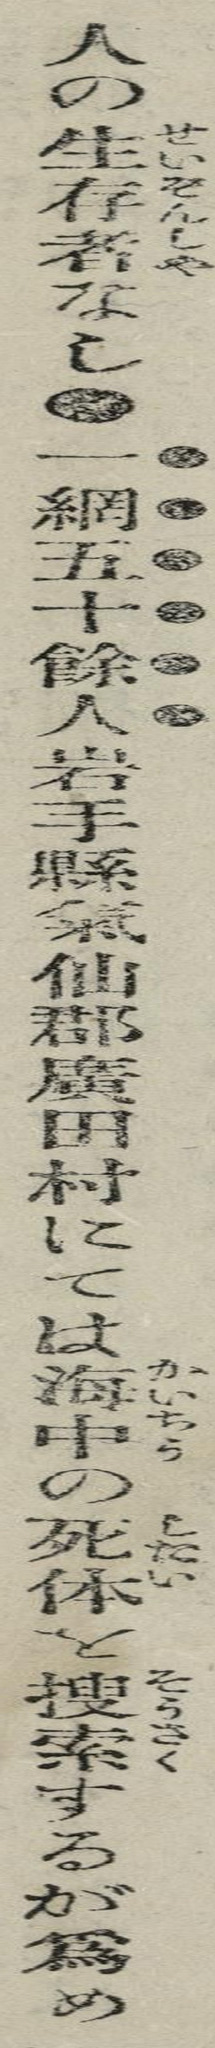人の生存者なし●一網五十餘人岩手県気仙郡廣田村にては海中の死体を捜索するが為め

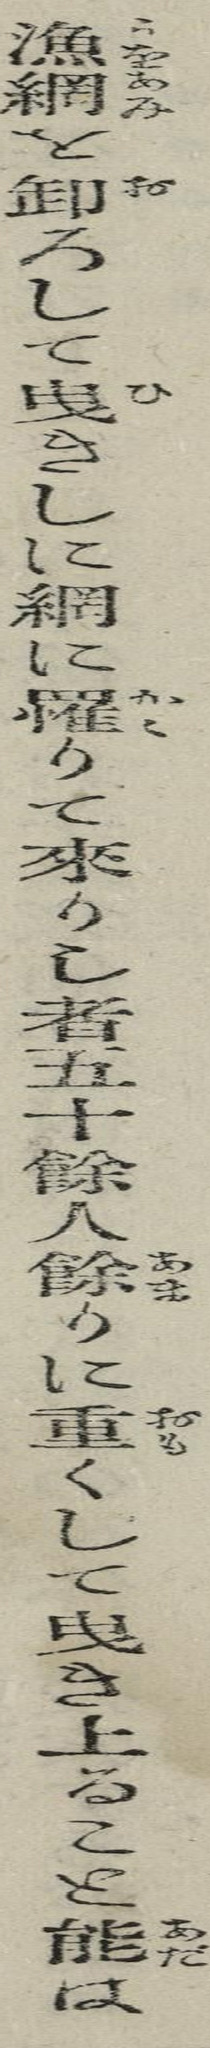漁網を卸ろして曳きしに網に罹りて来りし者五十餘人餘に重くして曳き上ること能は
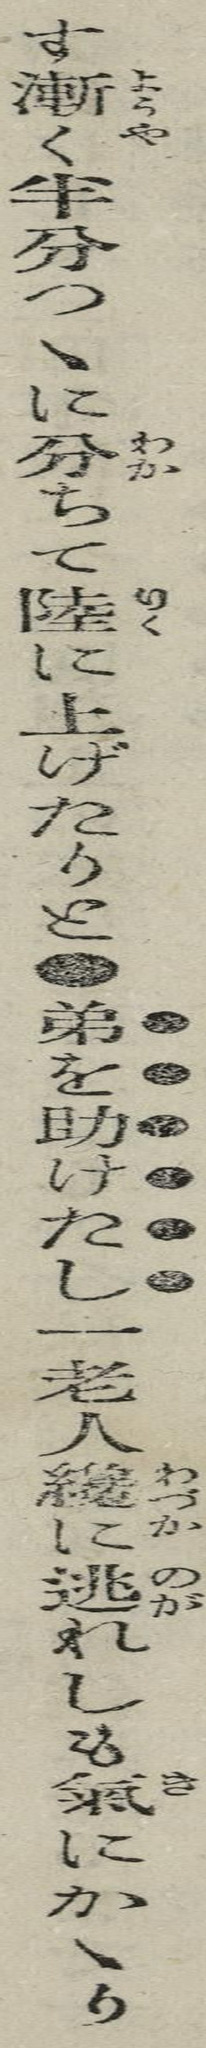す漸く半分つゝに分ちて陸に上げたりと●弟を助けたし一老人纔に逃れしも気にかヽり
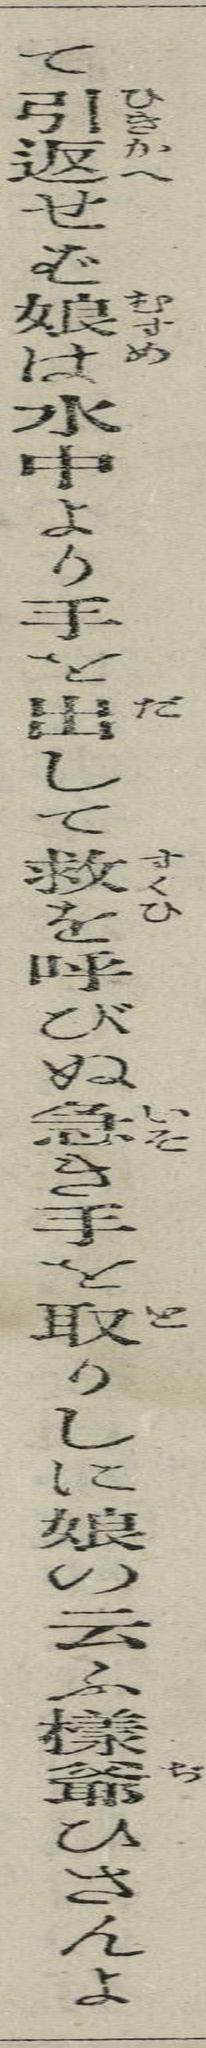て引返せば娘は水中より手を出して救を呼び急き手を取りしに娘の云ふ様爺ひさんよ
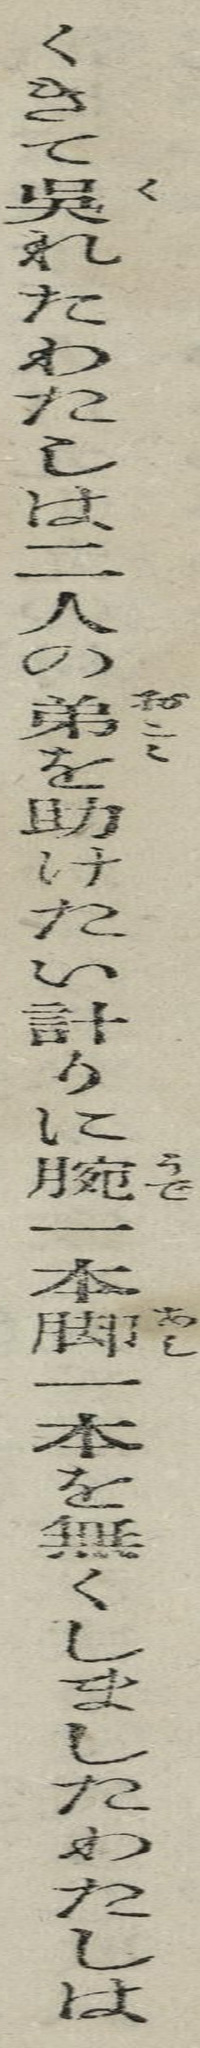くきて呉れたわたしは二人の弟を助けたい計りに腕一本脚一本を無くしましたわたしは
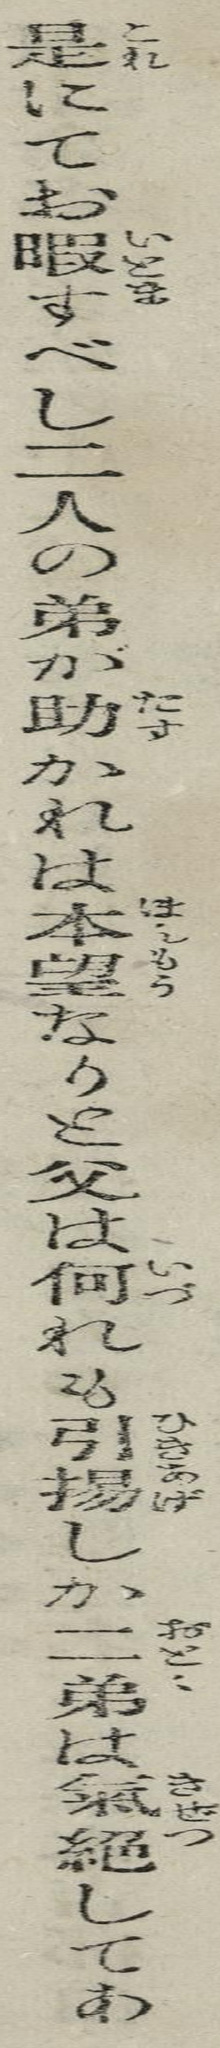是にてお暇すべし二人の弟が助かれは本望なりと父は何れも引揚しか二弟は気絶してあ
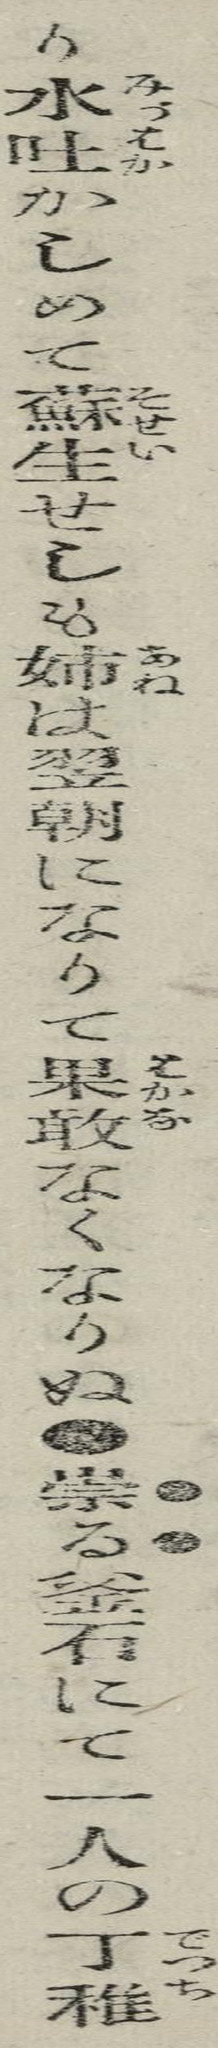り水吐かしめて蘇生せしも姉は翌朝になりて果敢なくなりぬ●祟る釜石にて一人の丁稚
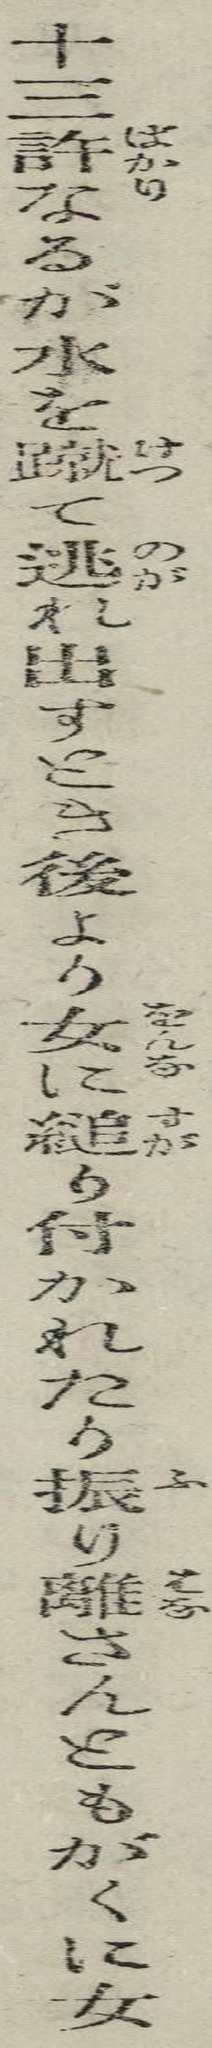十三計なるが水を蹴て逃れ出すとき後より女に縋り付かれたり振り離さんともがくに女
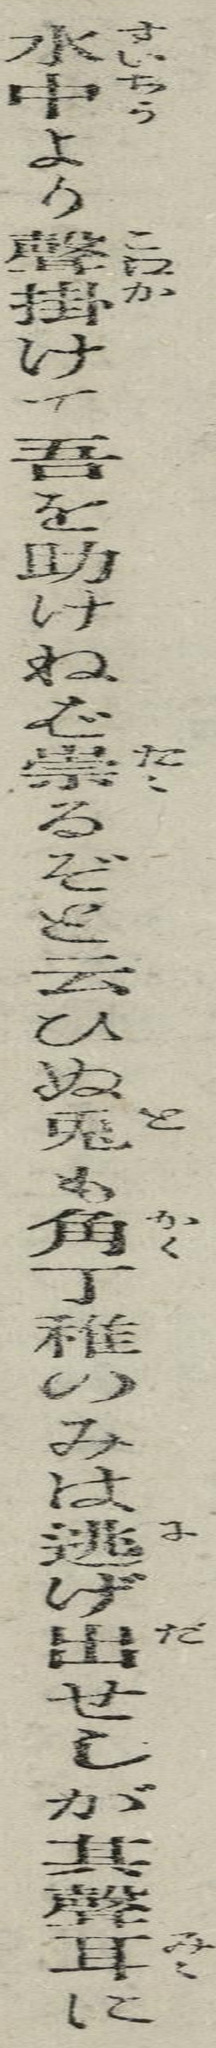水中より声掛けて吾を助けねば祟るぞと云ひぬ兎も角丁稚のみは逃げ出せしが其声耳に
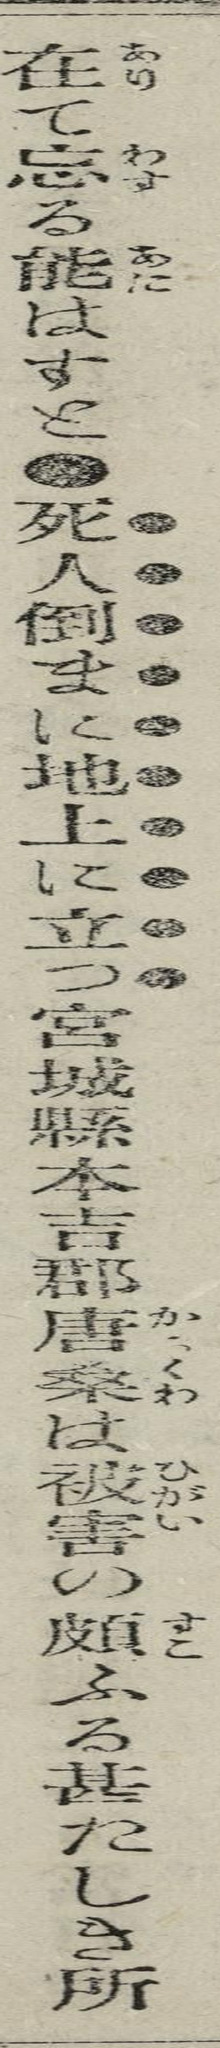在て忘る能はすと●死人倒まに地上に立つ宮城県本宮郡唐桑は被害の頗ふる甚たしき所
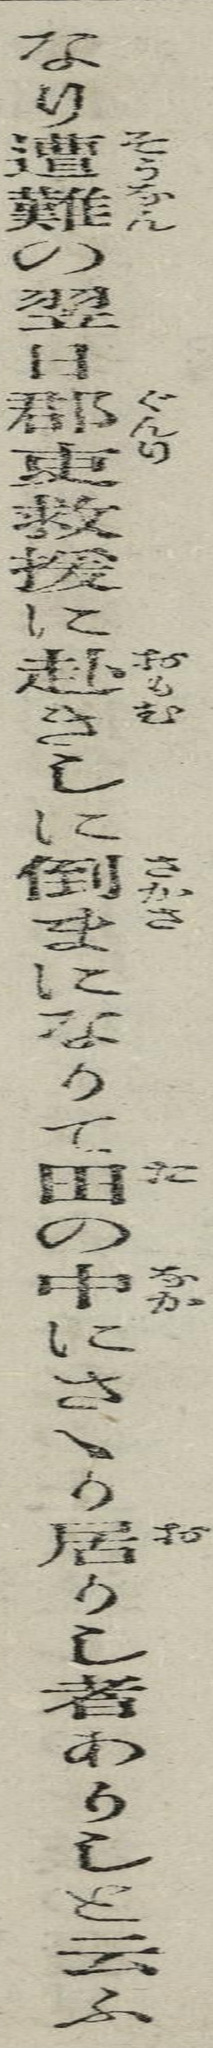なり遭難の翌日郡吏救援に赴きしに倒まになりて田の中にさヽり居りし者ありしと云ふ
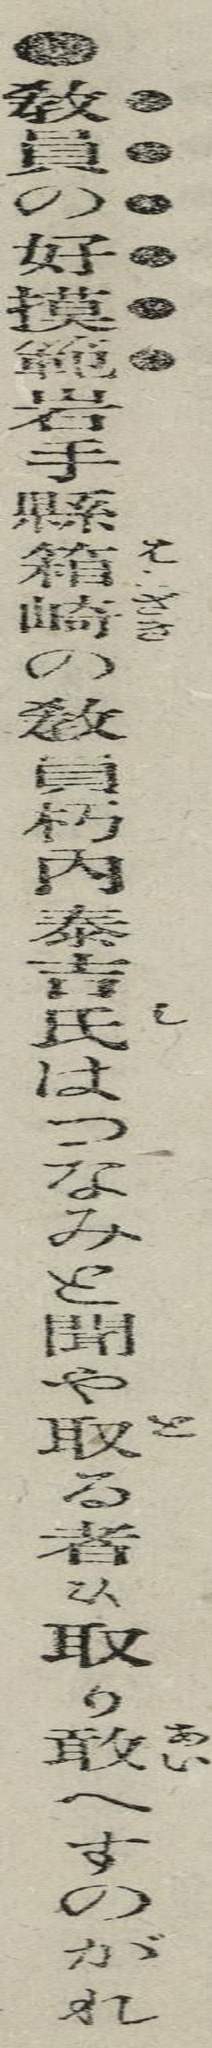●教員の好模範岩手県箱崎の教員朽内泰吉氏はつなみと聞や取る者も取り敢へすのがれ
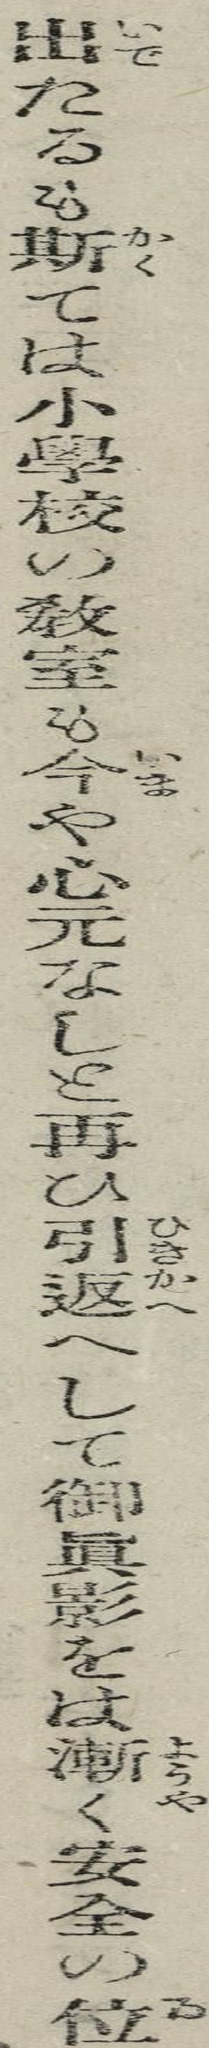出たるも斯ては小学校の教室も今や心元なしと再ひ引返へして御真影をは漸く安全の位
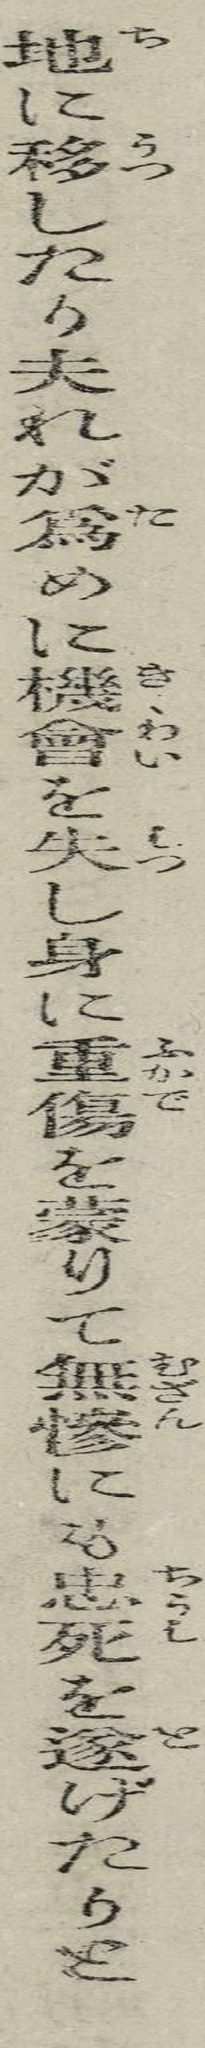地に移したり夫れが為めに機会を失し身に重傷を蒙りて無惨にも忠死を遂げたりと
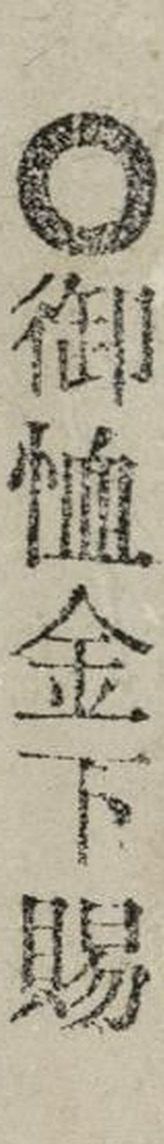○御恤金下賜
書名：三陸海嘯細見
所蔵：東京大学地震研究所図書室 Earthquake Research Institute Library, The University of Tokyo, JAPAN
